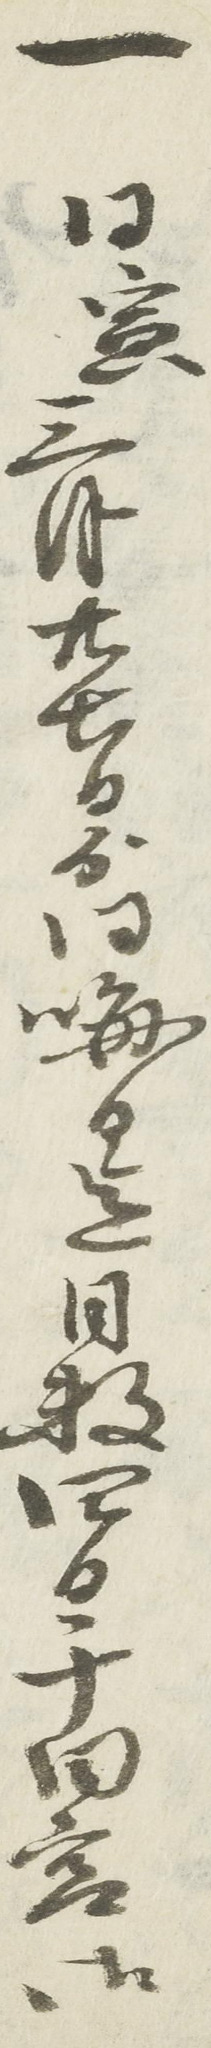一同寅三月廿七日ゟ同晦日迄日数四日千日宮御
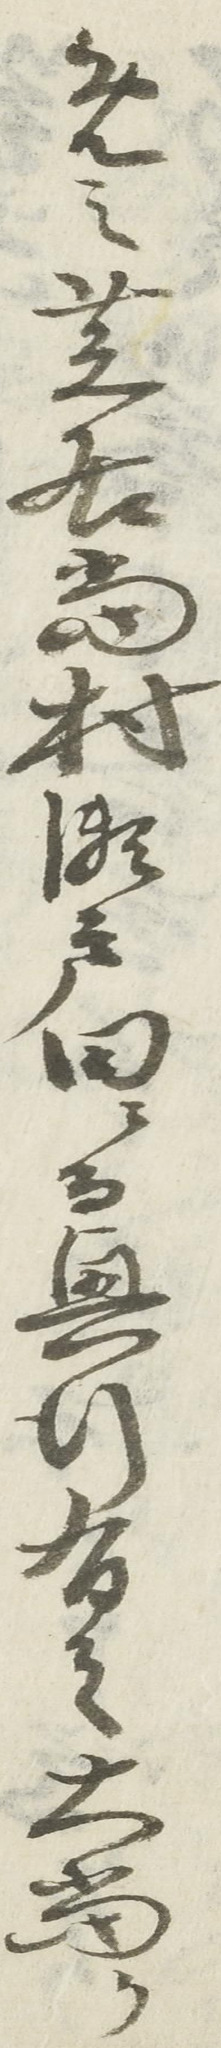免之芝居当村瀬戸田ニ而興業有之大当り
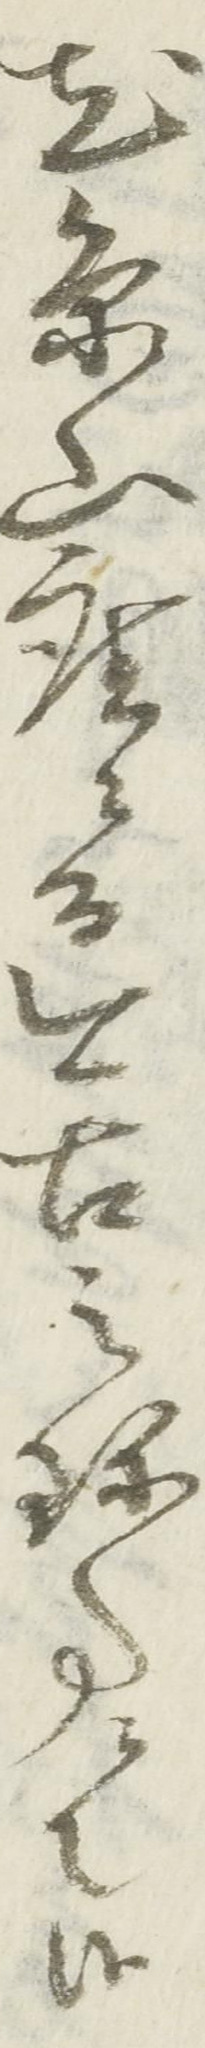尤原山座ニ而今古之珍事ニて候
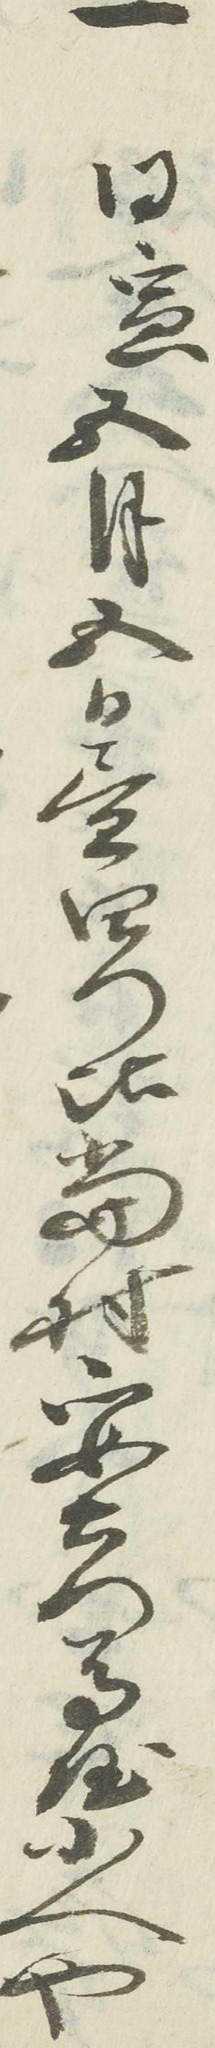一同寅五月五日昼四つ頃当村安右衛門馬屋小へや
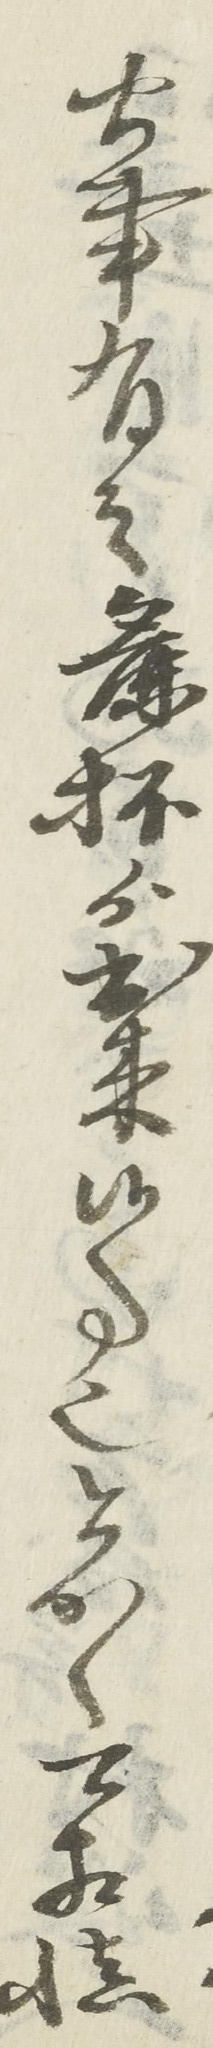火事有之麁抔ゟ出来候事也とかく可相慎
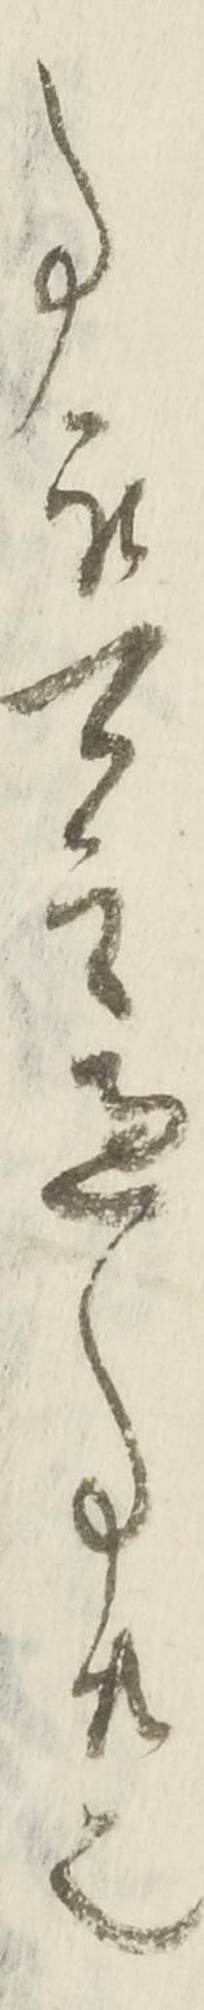事被可之通事共也
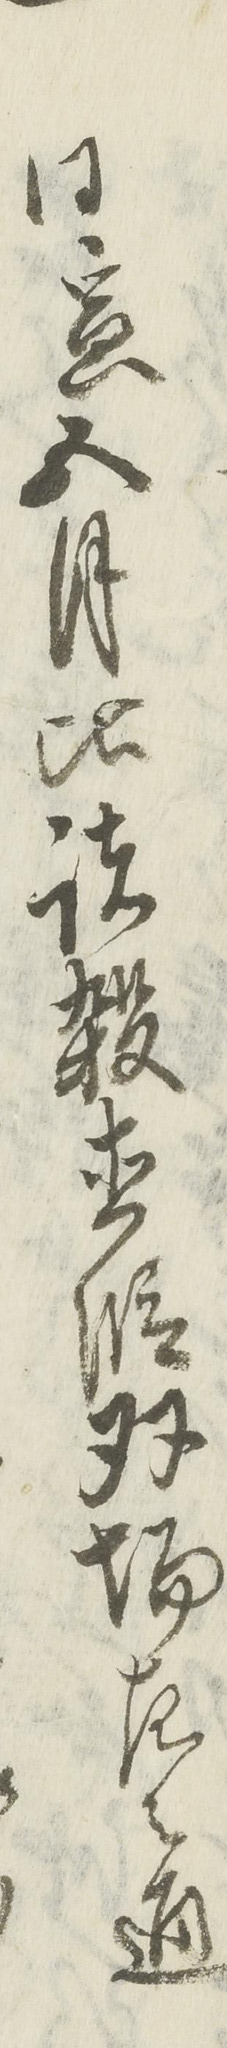一同寅五月比諸穀直段双場左之通
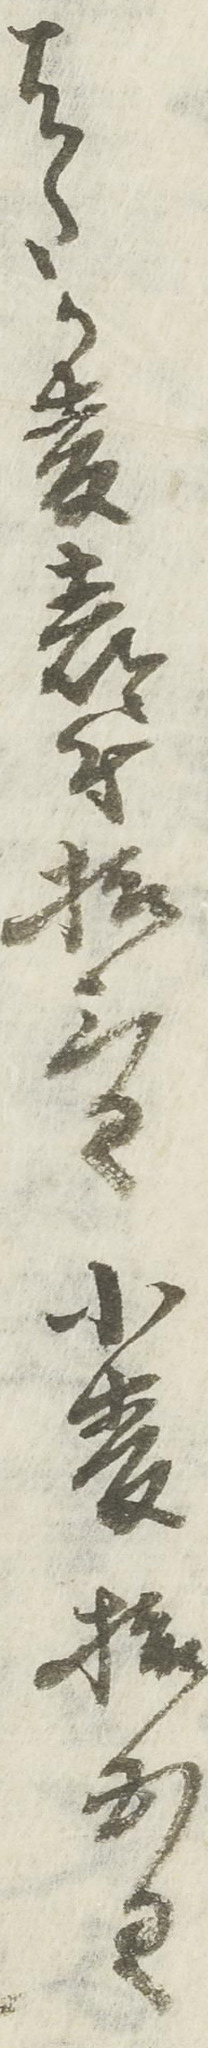はたか麦壱表ニ付拾三匁小麦拾五匁
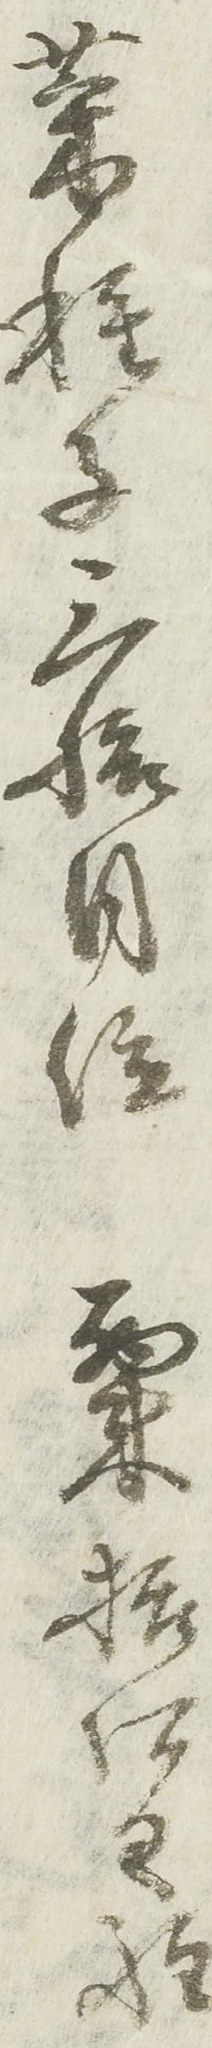菜種子三拾目位粟拾四匁程
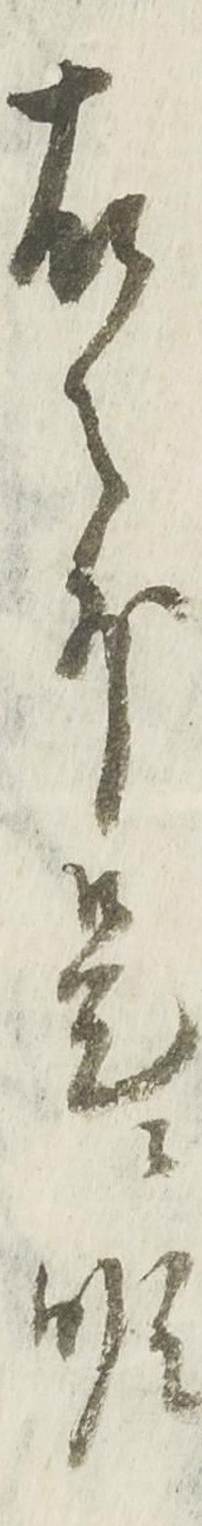右之外是ニ順
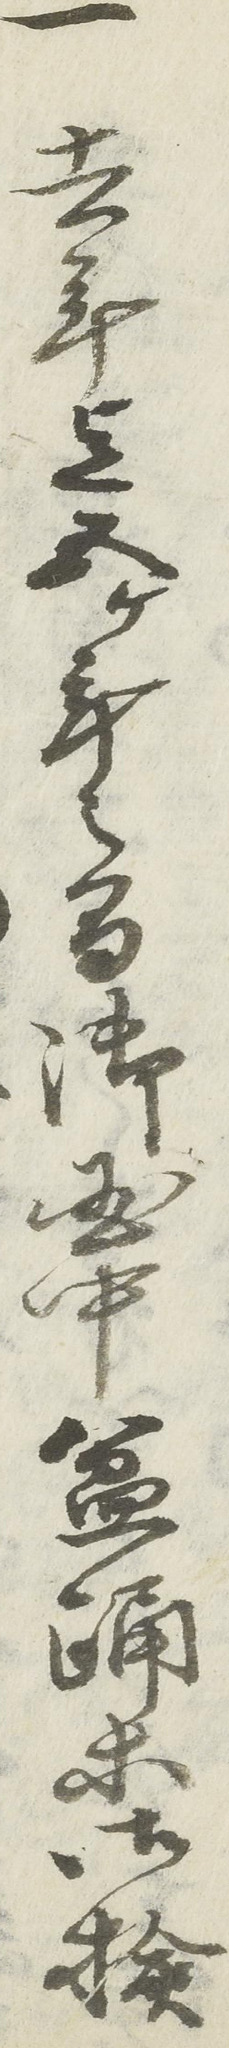一去年迄五ケ年之間御国中盆踊等御検
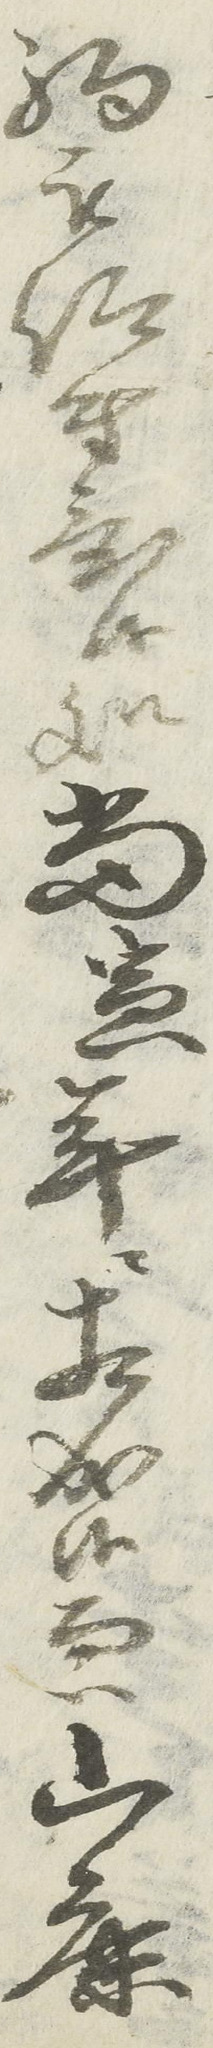約被仰付置候処当寅年ニ相成候而は山鹿
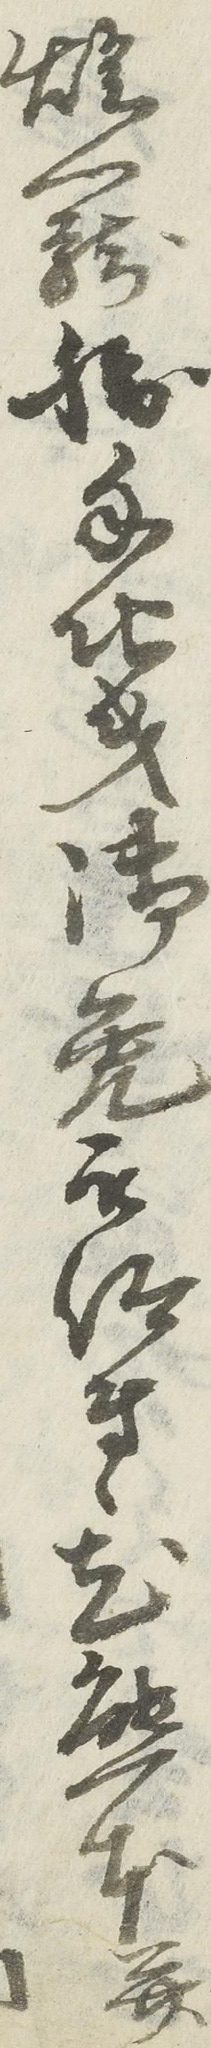燈籠勝手次第御免被被仰付候尤熊本并
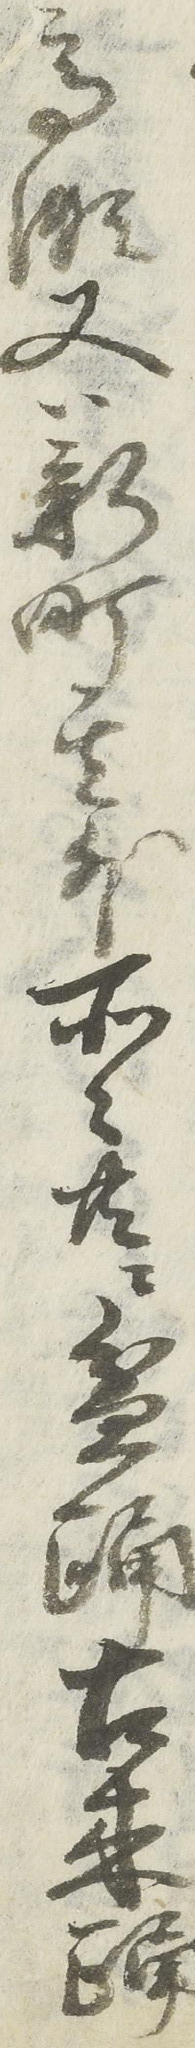高瀬又は新町其外所々共ニ盆踊古来踊
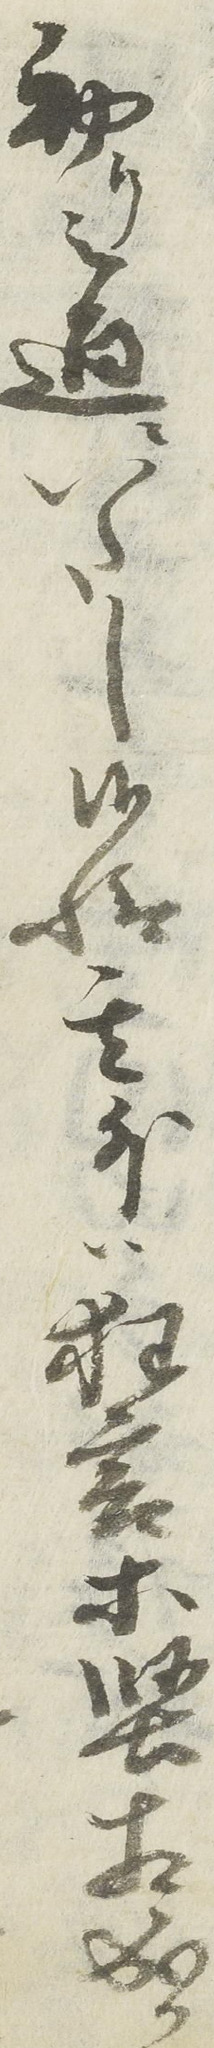初り之通ニいたし候様其外は狂言等堅相成り
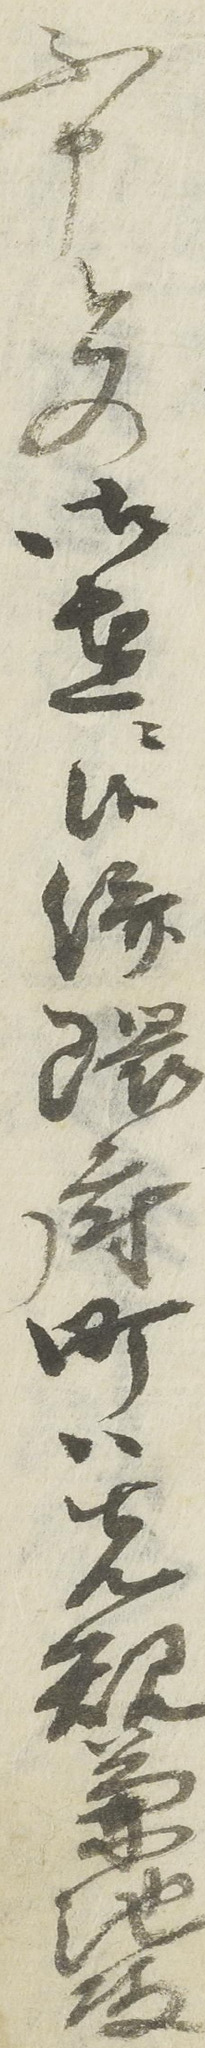不申との御達ニ候併隈府町は先規菊池殿
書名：後見笑
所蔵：東京大学地震研究所図書室 Earthquake Research Institute Library, The University of Tokyo, JAPAN
